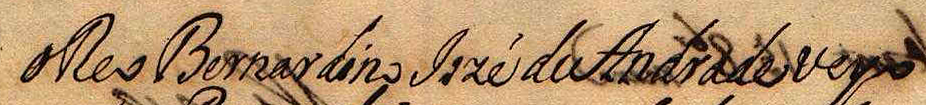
o Reo Bernardino Iozé de Andrade veyo
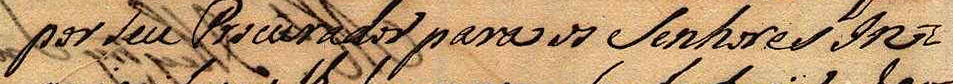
por seu Procurador para os Senhores In
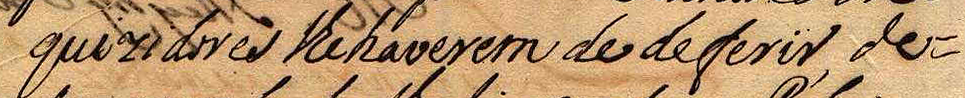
quizidores lhe haverem de deferir de
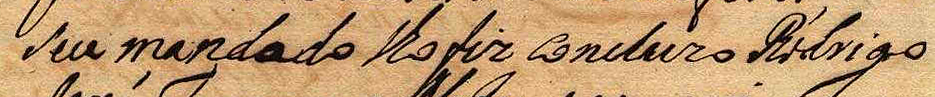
seu mandado lho fiz concluzo Rodrigo
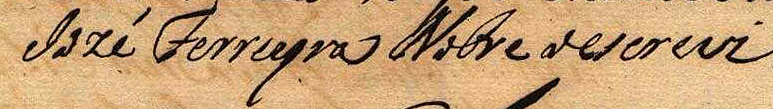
Ioze Ferreyra Nobre o escrevi
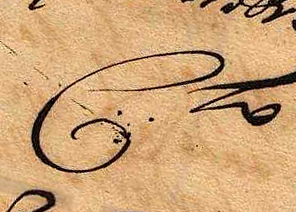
C.Lo
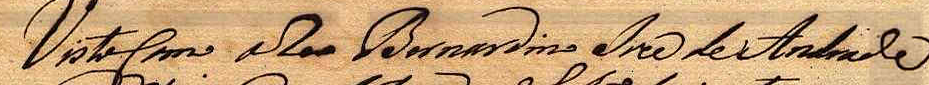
Visto Como o Reo Bernardino Ioze de Andrade
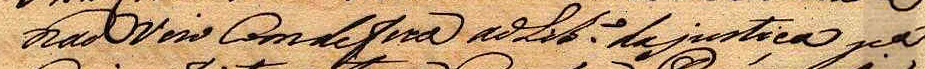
naõ veio Com defeza ao Lib.o da justiça p.a
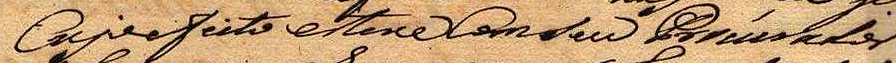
Cujo efeito esteue Com seu Procurador
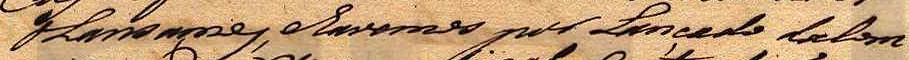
o Lansamos, e havemos por Lançado da Com
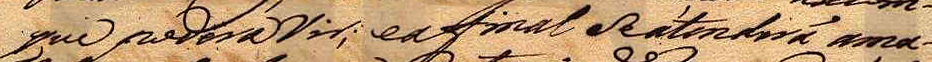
que podera Vir; e afinal se atenderá a ma
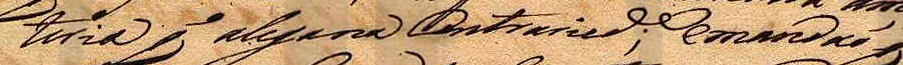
teria q̄ alega na Contraried;e e mandaõ q̄
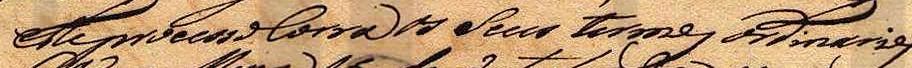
este processo Corra os seus termos ordinarios
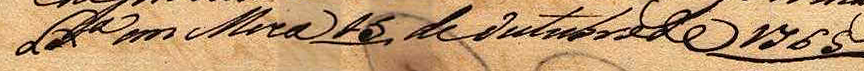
Lxa em Meza 15 de outubro de 1765
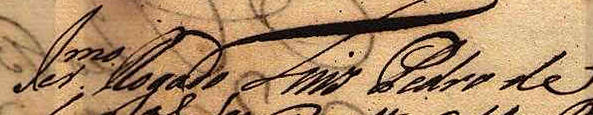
Ier.mo Rogado Luis Pedro de
